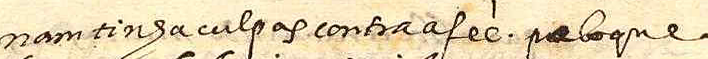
nam tinha culpas contra a feé. p_lo que
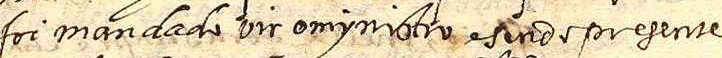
foi mandado vir o mynistro e sendo presente
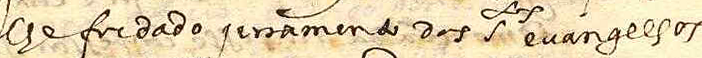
lhe foi dado juramento dos stos euangelhos
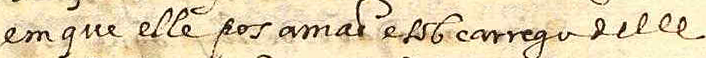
em que elle pos a maõ e sob carrego delle
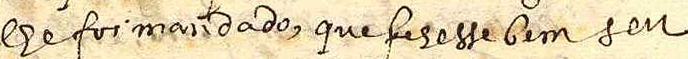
lhe foi mandado, que fezesse bem seu
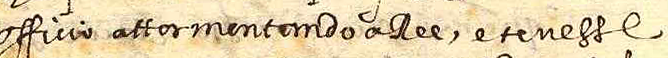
officio attormentando a Ree, e teuesse
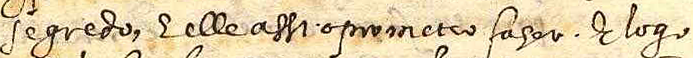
segredo, E elle assi o prometeo fazer. E logo.
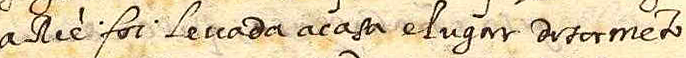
a Reé. foi Leuada a casa e lugar de tormēto
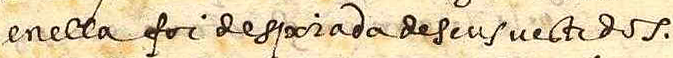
e nella foi despoiada de seus uestidos.
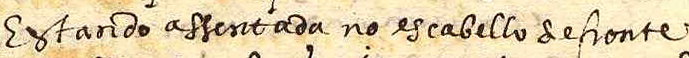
Estando assentada no escabello defronte
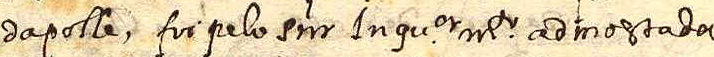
da polle, foi pelo sn̄r Inqu.or mto. admoestada
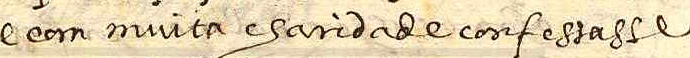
e com muita charidade confessasse
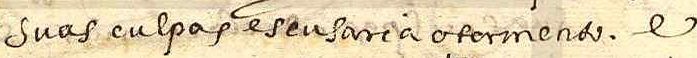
suas culpas escusaria o tormento. E
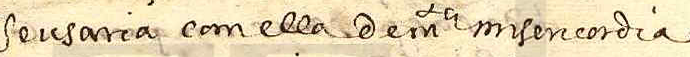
se usaria com ella de mta misericordia
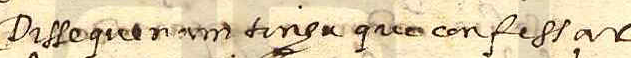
Disse que nam tinha que confessar
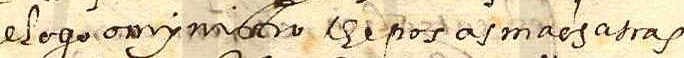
e logo o mynistro lhe pos as maõs atras
